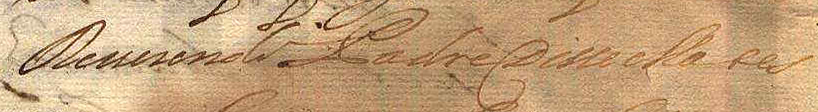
Reuerendo Padre Disse ella tes
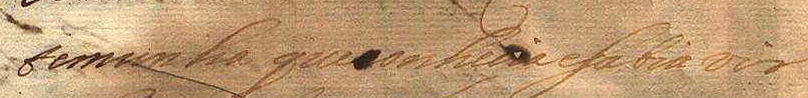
temunha que conhecia e sabia vir
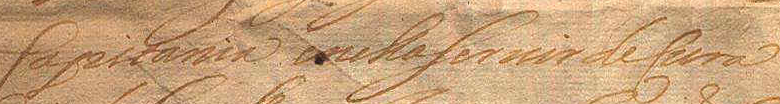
Capitania e nella seruir de Cura
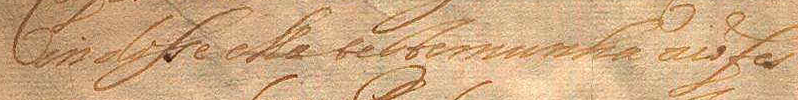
indosse elle testemunha a cōfes
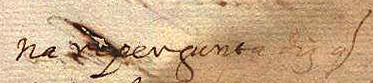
na repergunta diz q̄
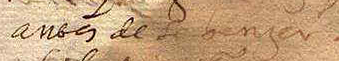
antes de se benzer
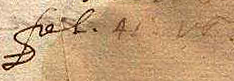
fol. 41 vso
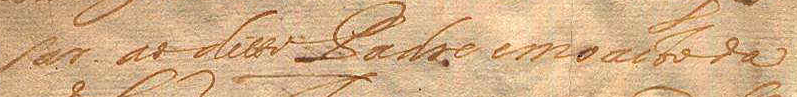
sar ao ditto Padre em o acto da
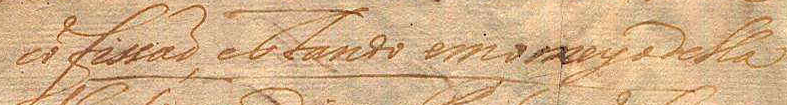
cōfissão, estando em o meyo della
